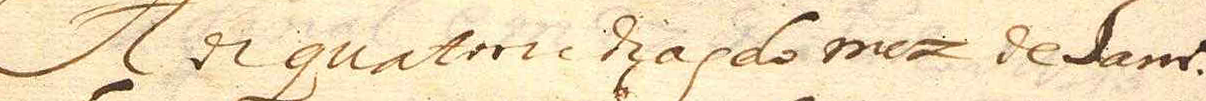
Aos quatorze dias do mez de Ianr.o
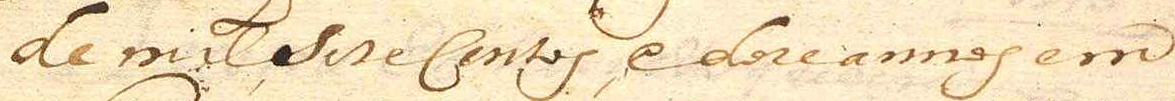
de mil, seteCentos, e doze annos em
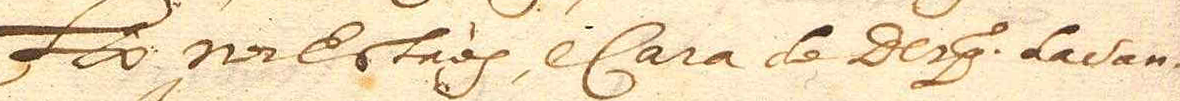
Lxa nos Estaos, e Caza do Desp.o da san
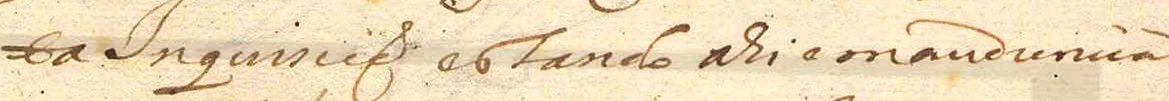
ta Inquisiçaõ estando ahi em audiencia
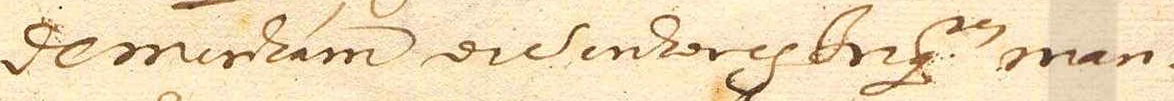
de menham os Senhores Inq.res man
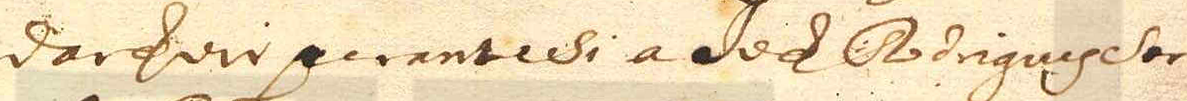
daraõ vir perante si a Ioaõ Rodrigues Sor
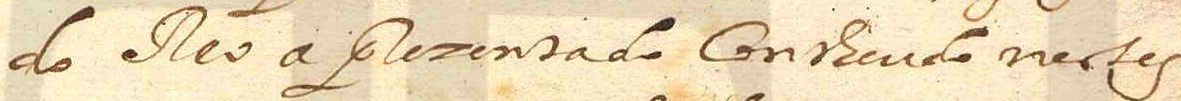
do Reo aprezentado Contheudo nestes
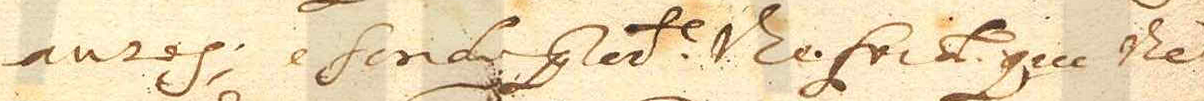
autos; e sendo prez.te lhe foi d̄.o que lhe
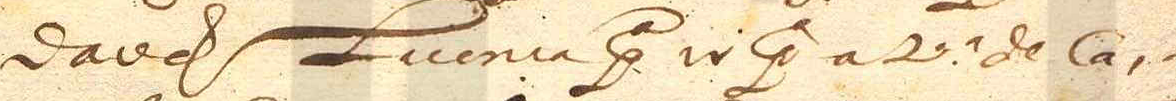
davaõ Licença pa ir pa a V.a de Cas
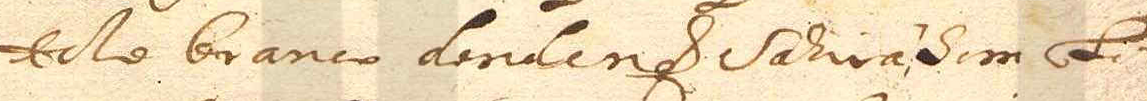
telo branco donde naõ sahira, Sem Li
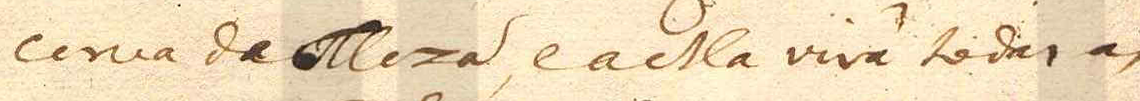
cença da Meza, e a ella virá todas as
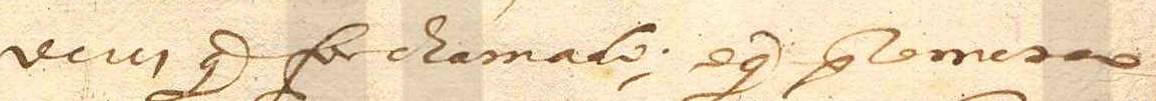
vezes q̄ for chamado; e q̄ premeteo
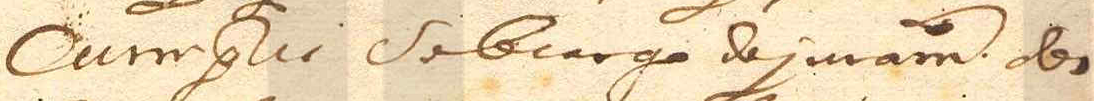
Cumprir sob cargo do juram.to dos
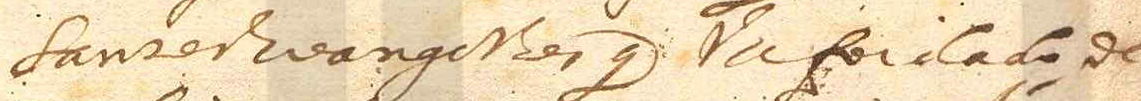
santos Evangelhos q̄ lhe foi dado de
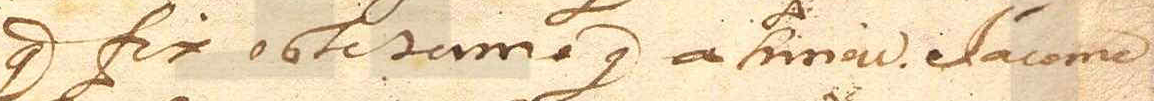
q̄ fis este termo q̄ assinou Iacome
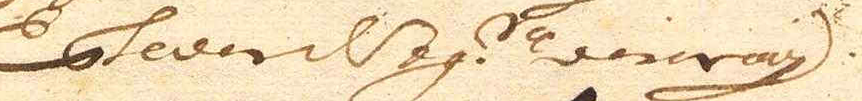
Esteves Nog.ra o escrevj.
